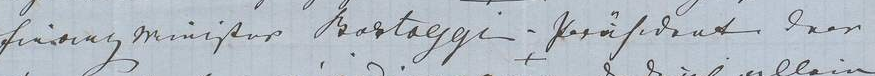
Finanz Minister Bartoggi – Präsident der
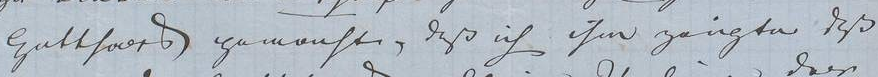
Gotthard gemacht, daß ich ihm zeigte, daß
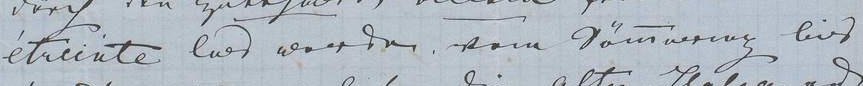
étreinte los werden, vom Sömmering bis
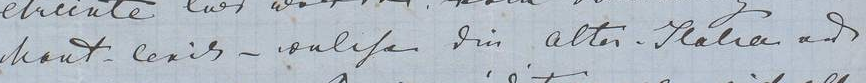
Mont-Cenis – welchen die alta Italia und
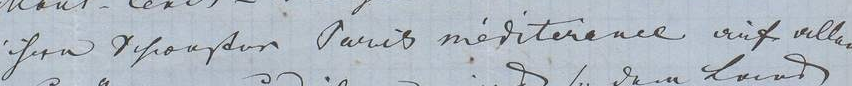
ihre Schwester Paris méditeranee auf allen
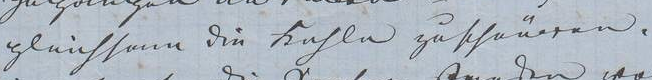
gleichsam die Kohle zuscheuren. –
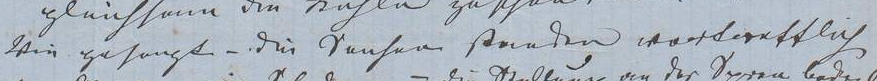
Wie gesagt – die Sachen standen vortrefflich
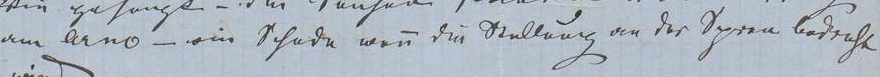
am Arno – ein Schade wenn die Stellung an der Spree bedroht
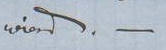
wird. –
